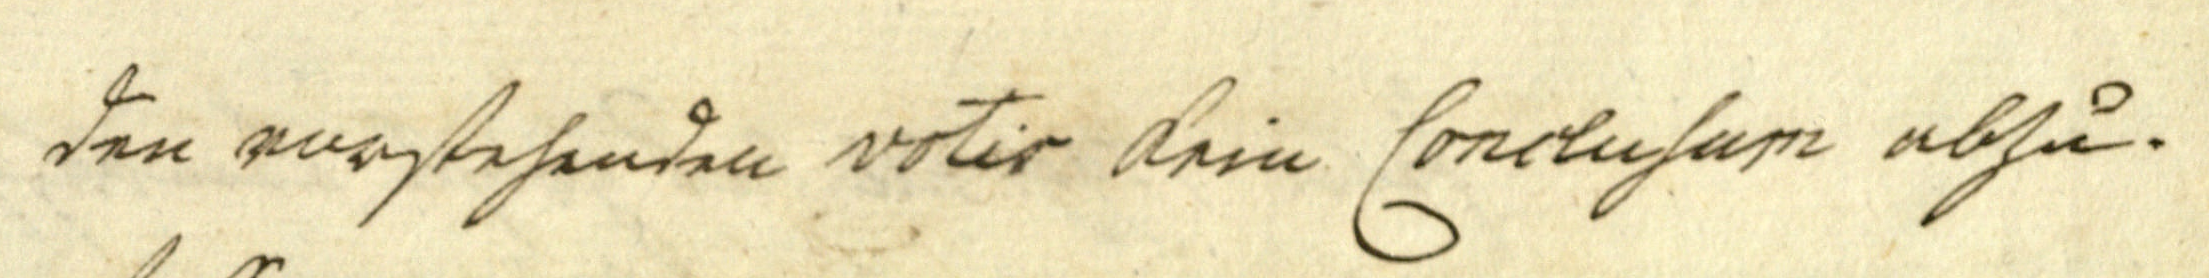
den vorstehenden votis kein Conclusum abzu¬
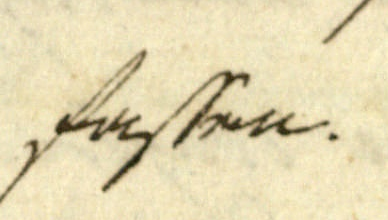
fassen.
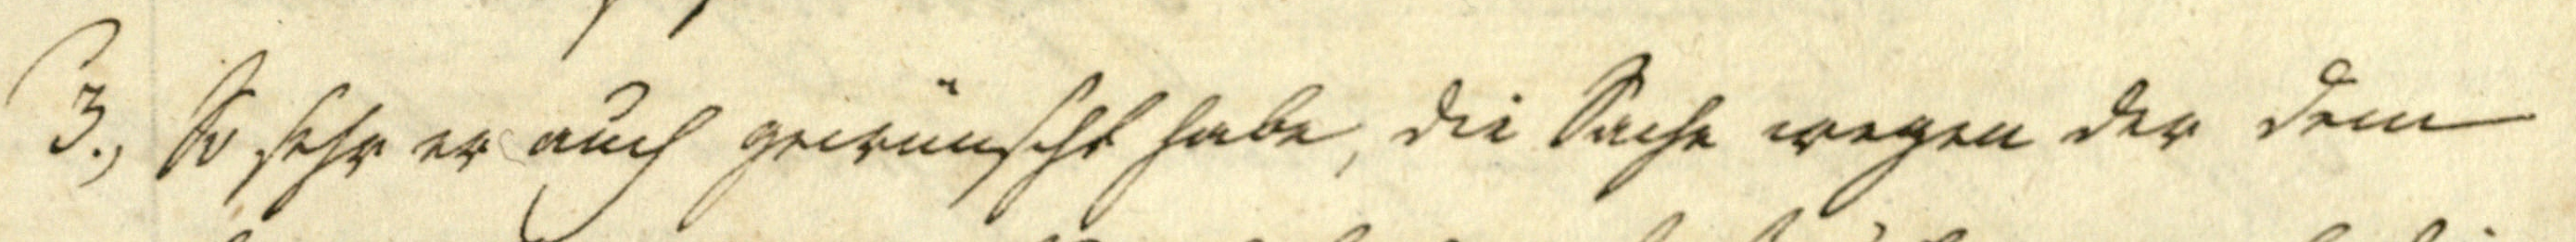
3., So sehr er auch gewünscht habe, die Sache wegen der dem
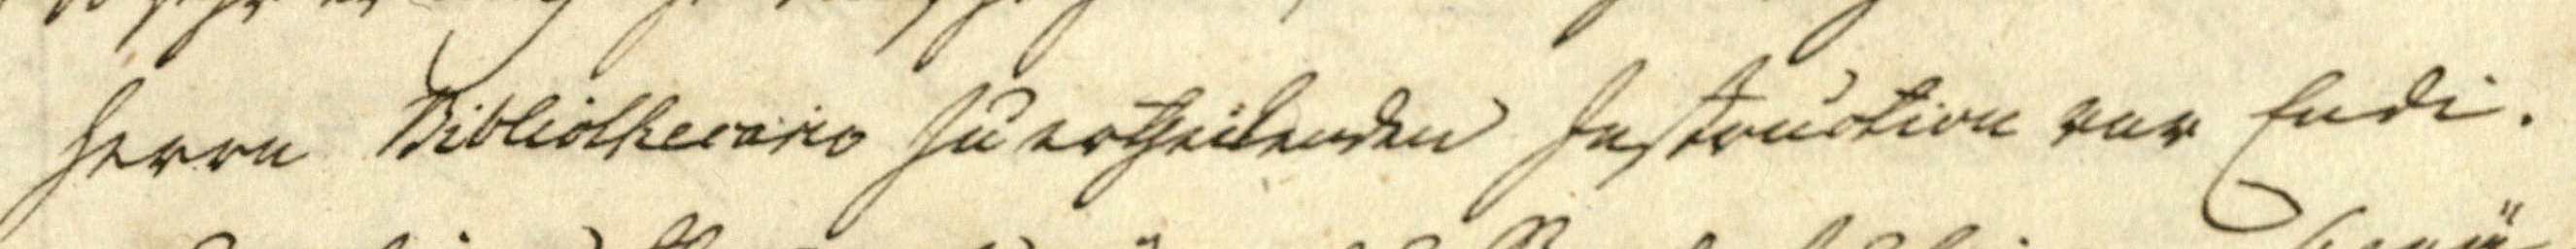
Herrn Bibliothecario zu ertheilenden Instruction vor Endi¬
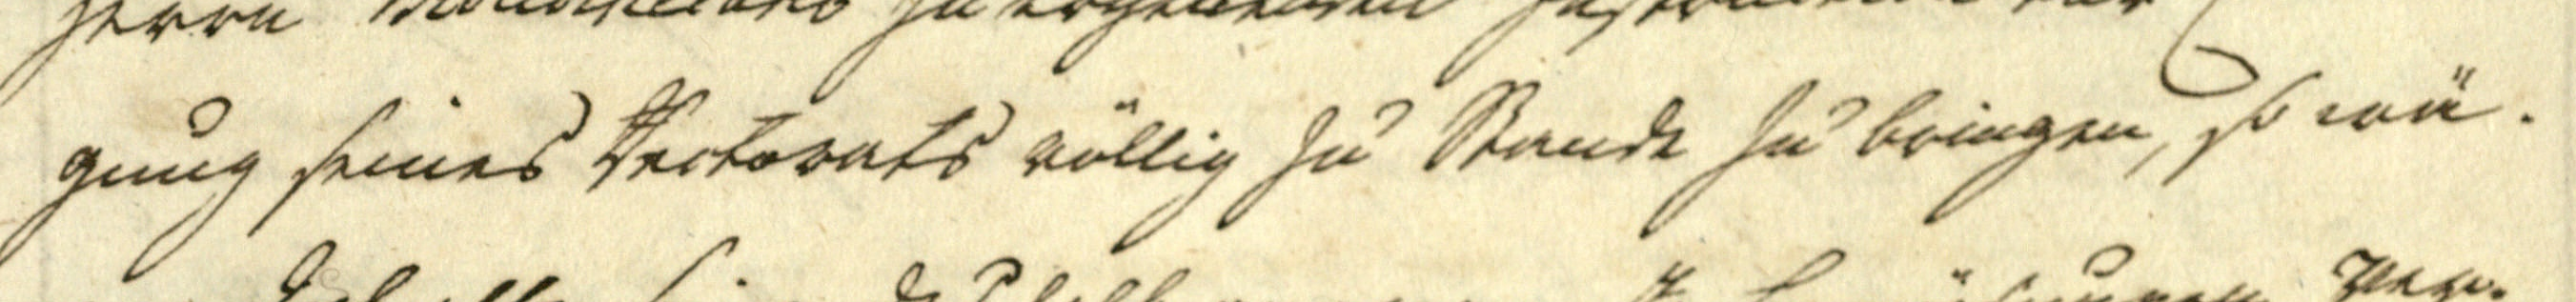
gung seines Rectorats völlig zu Stande zu bringen, so wä¬
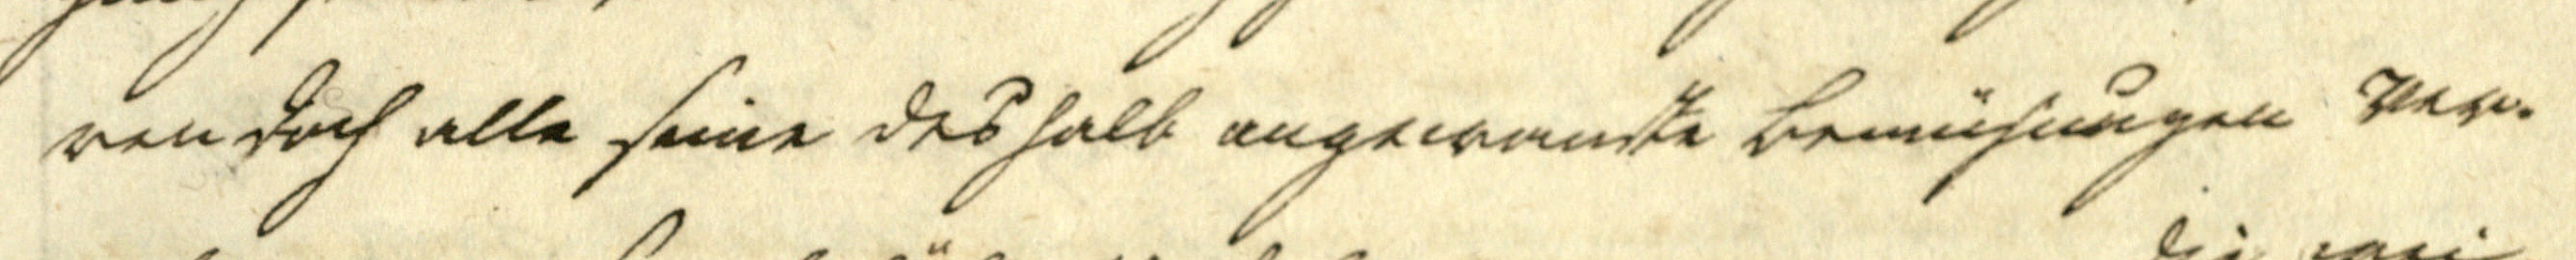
ren doch alle seine deshalb angewandte Bemühungen ver¬
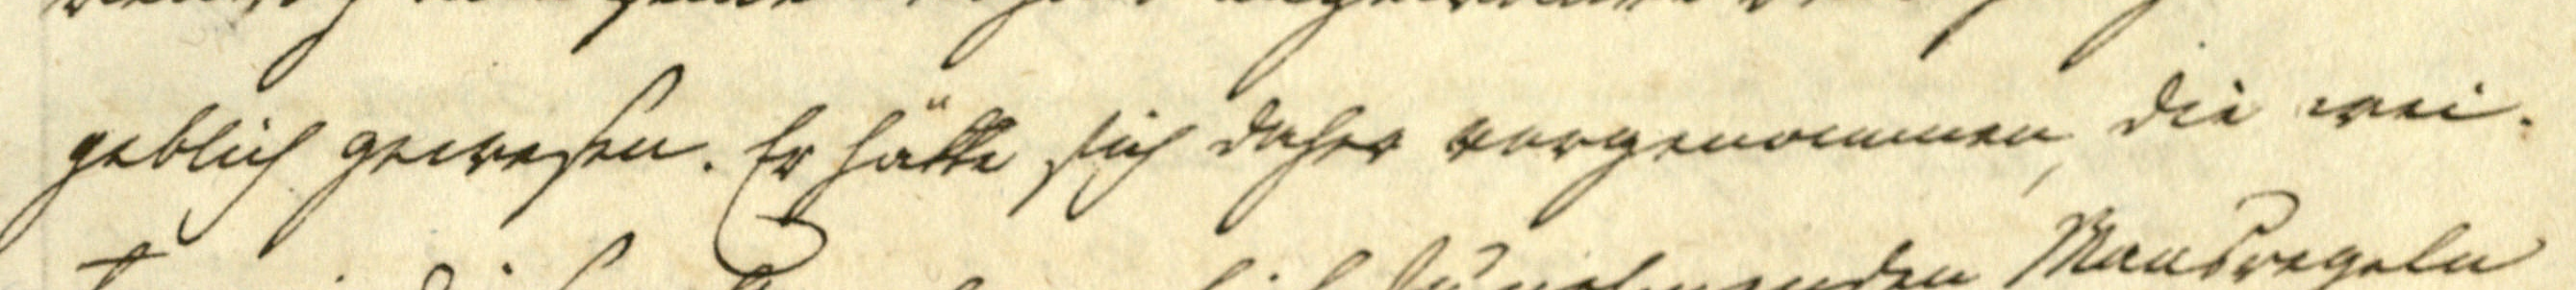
geblich gewesen. Er hätte sich daher vorgenommen, die wei¬
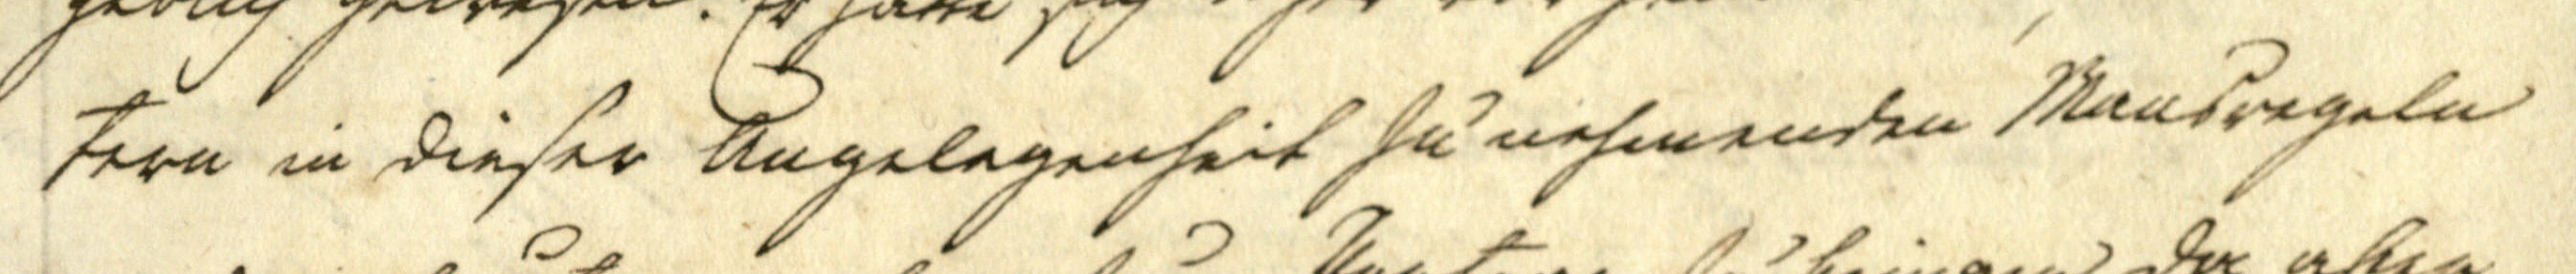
tern in dieser Angelegenheit zu nehmenden Maasregeln
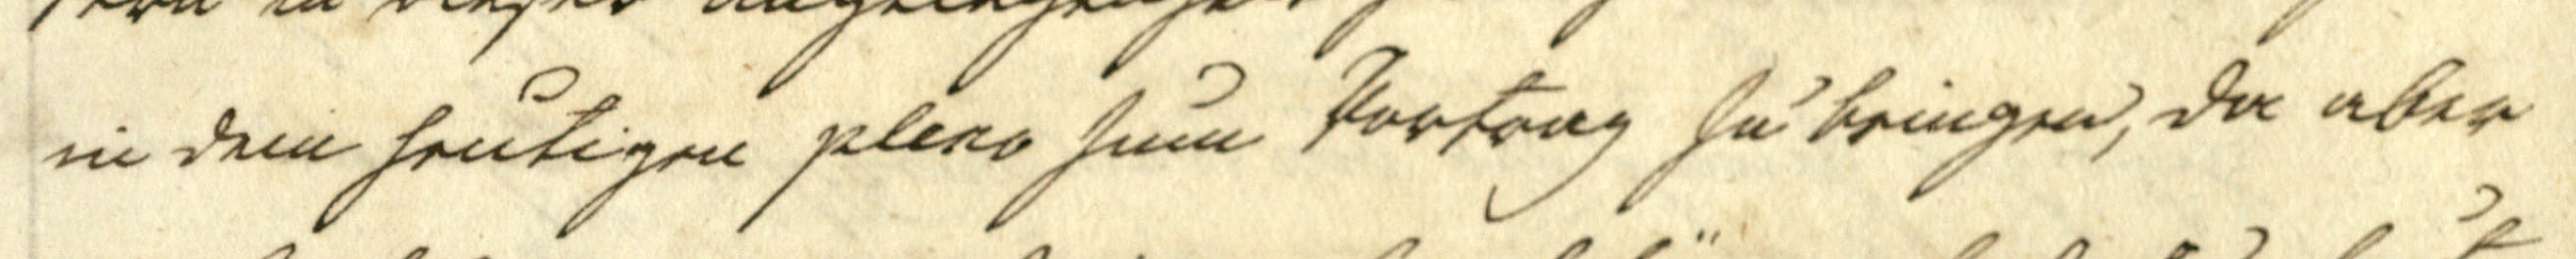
in dem heutigen pleno zum Vortrag zu bringen, da aber
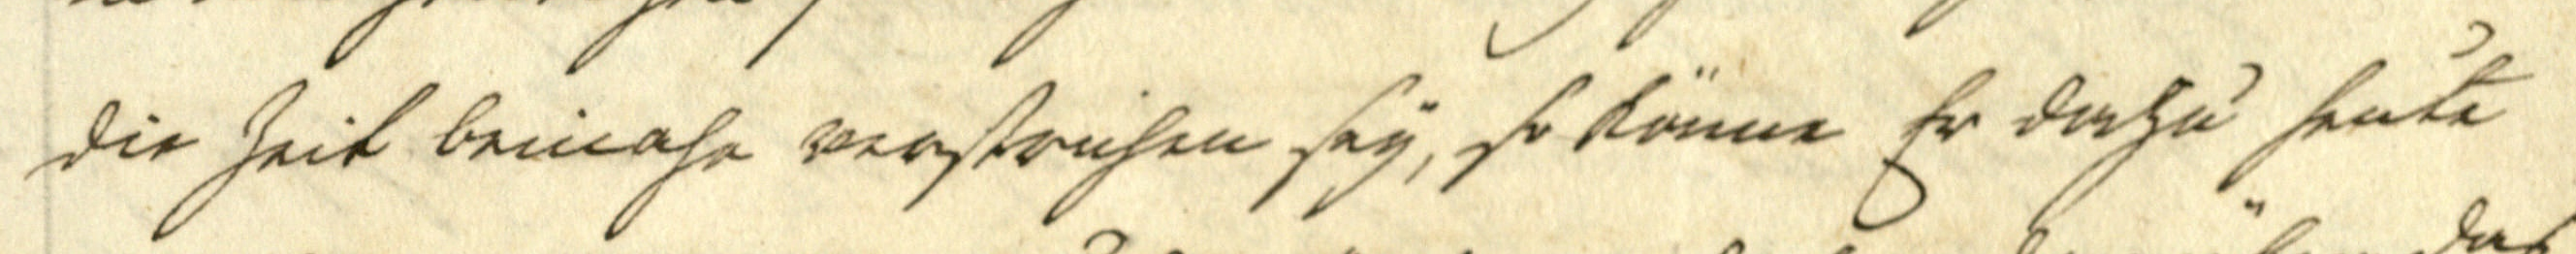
die Zeit beinahe verstrichen seÿ, so könne Er dazu heute
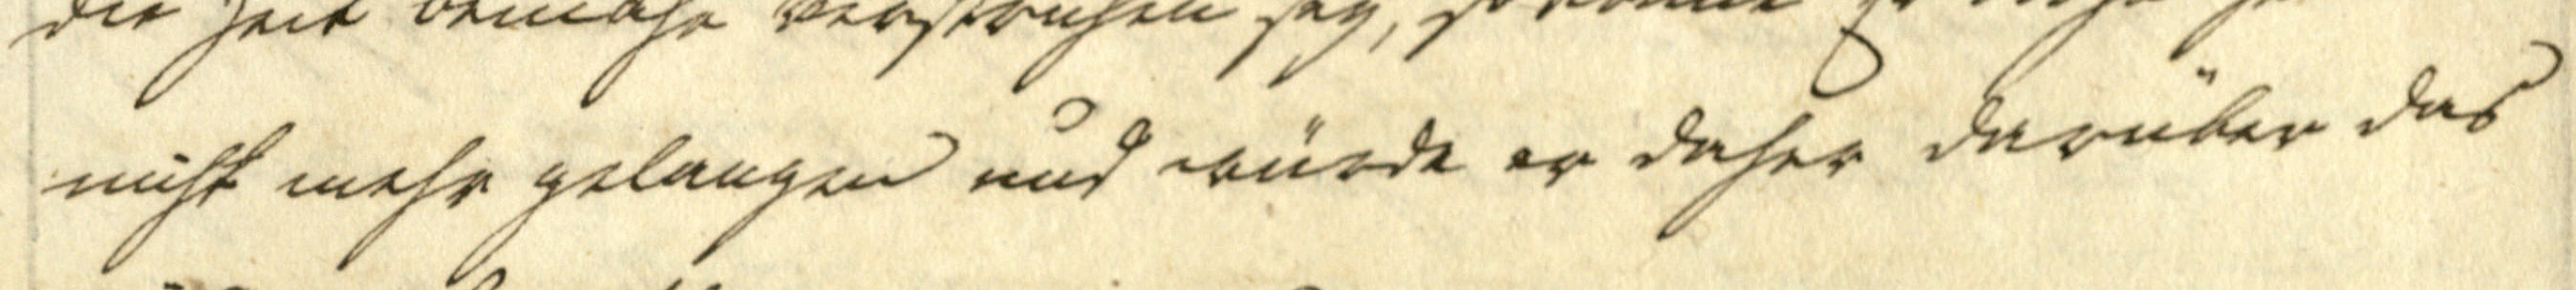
nicht mehr gelangen und würde er daher darüber das
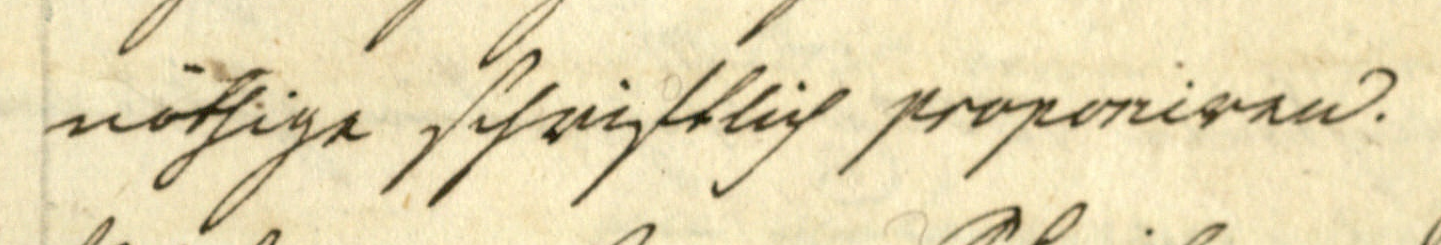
nöthige schriftlich proponiren.
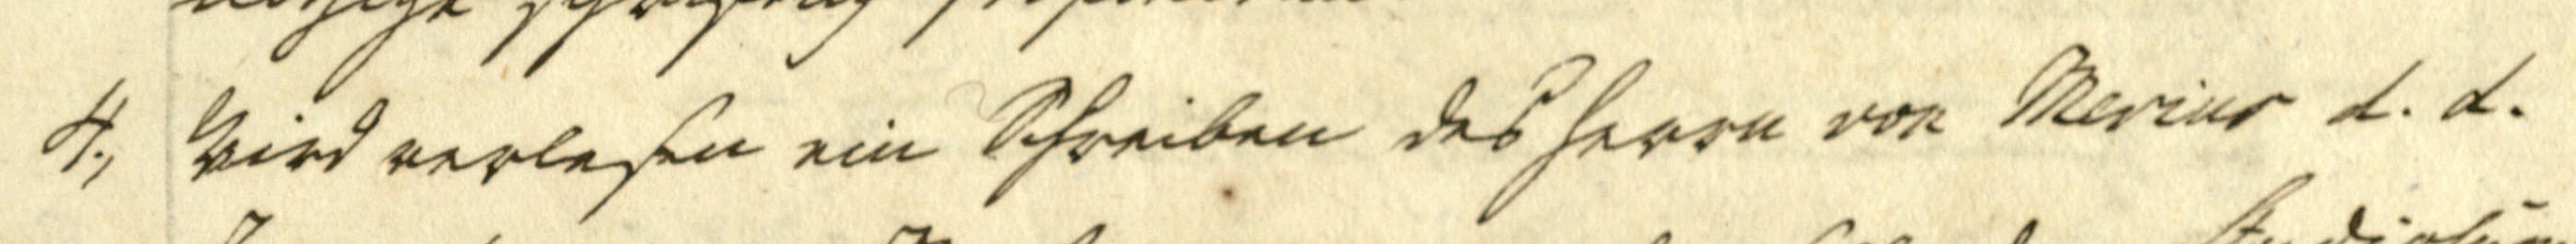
4, Wird verlesen ein Schreiben des Herrn von Mevius d. d.
